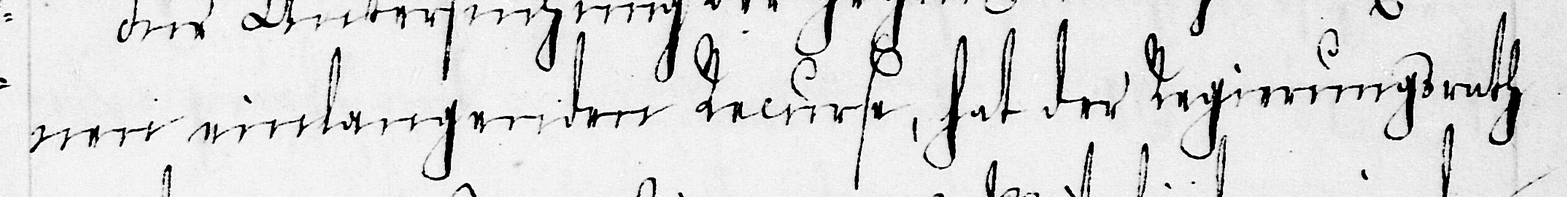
nen einlangenden Recurse, hat der Regierungsrath
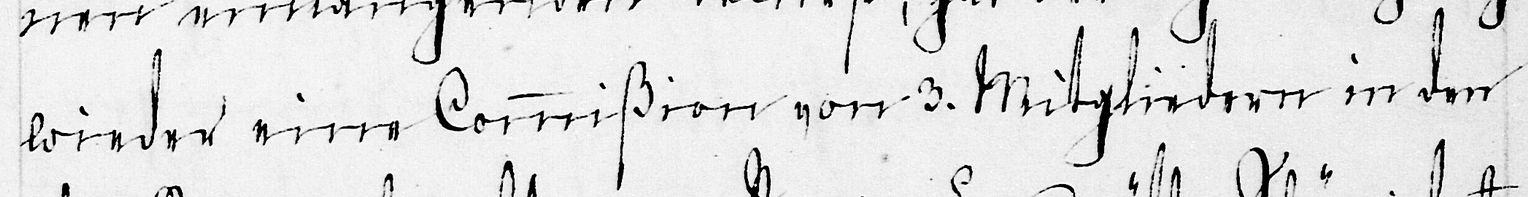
wieder eine Commißion von 3. Mitgliedern in den
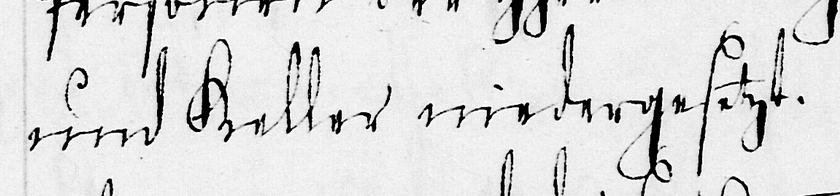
und Keller niedergesetzt.
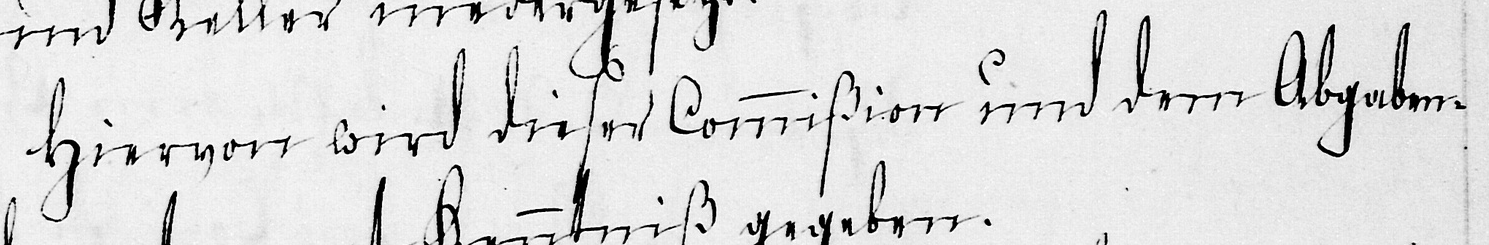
Hiervon wird dieser Commißion und dem Abgaben¬
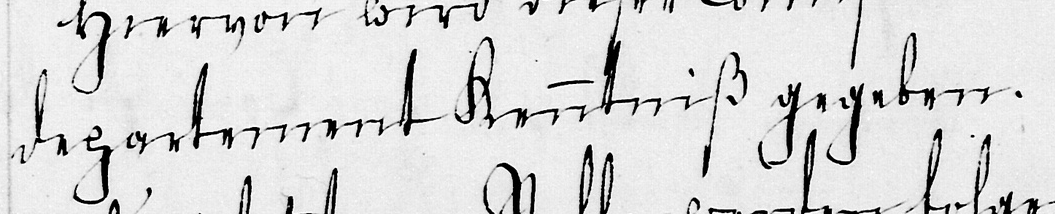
departement Kenntniß gegeben.
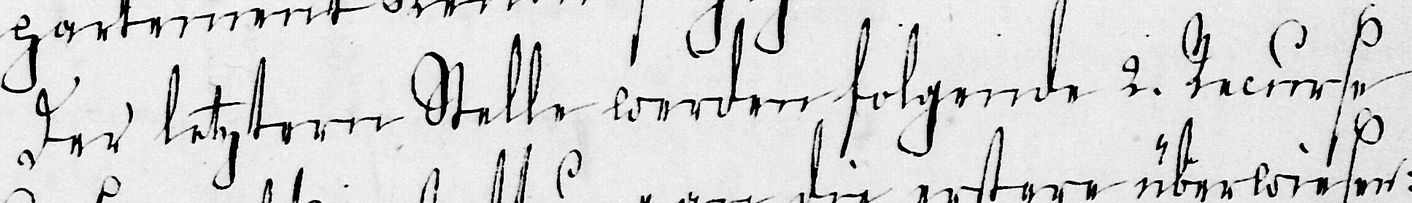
Der letztern Stelle werden folgende 2. Recurse
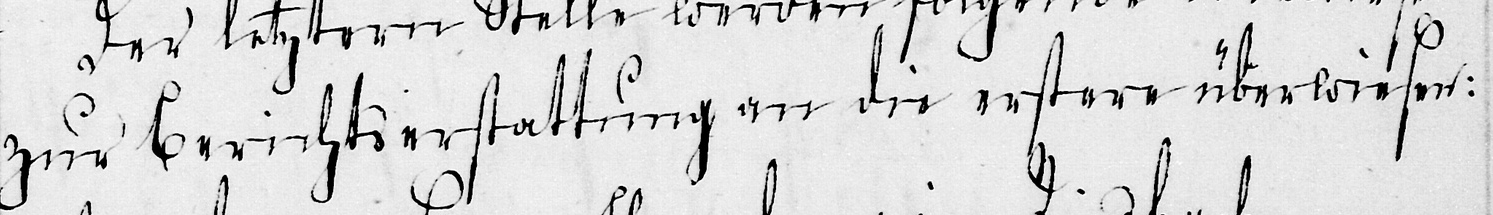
zur Berichtserstattung an die erstere überweisen:
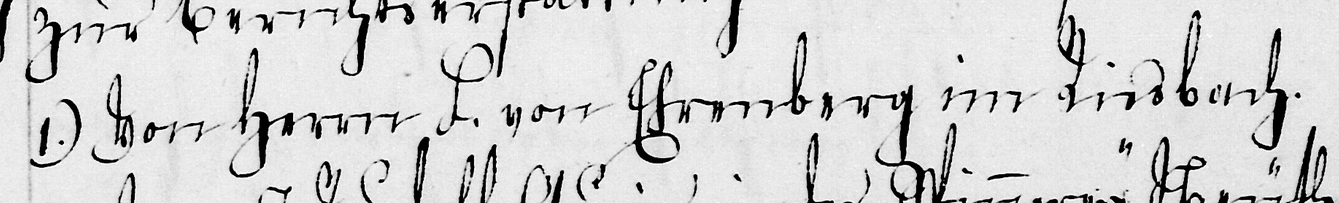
1.) Von Herrn F. von Ehrenberg im Riesbach
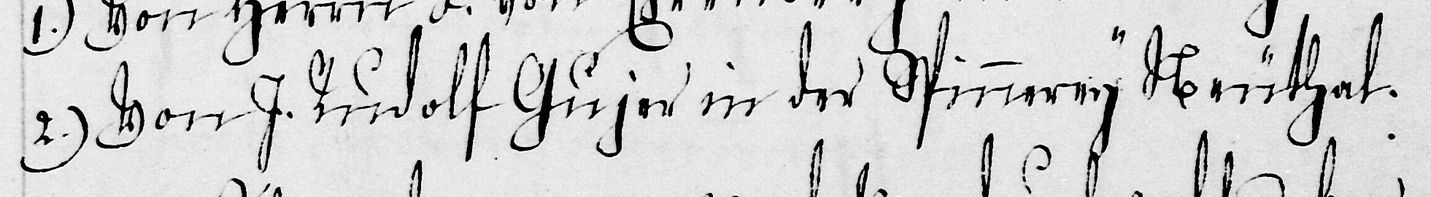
2.) Von J. Rudolf Gujer in der Spinnerey Neuthal.
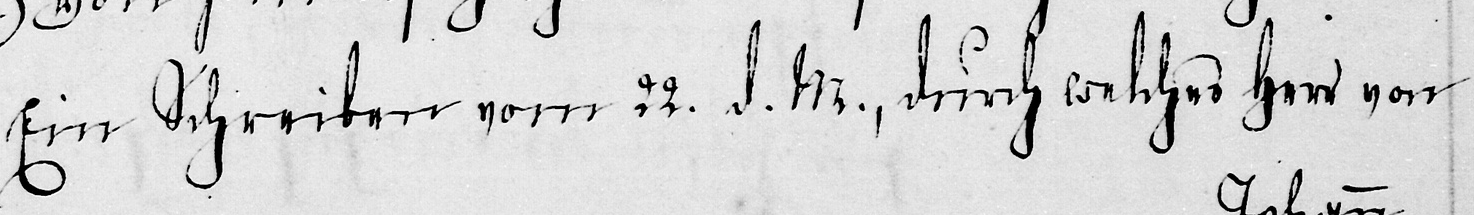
Ein Schreiben vom 22. d. M., durch welches Herr von
